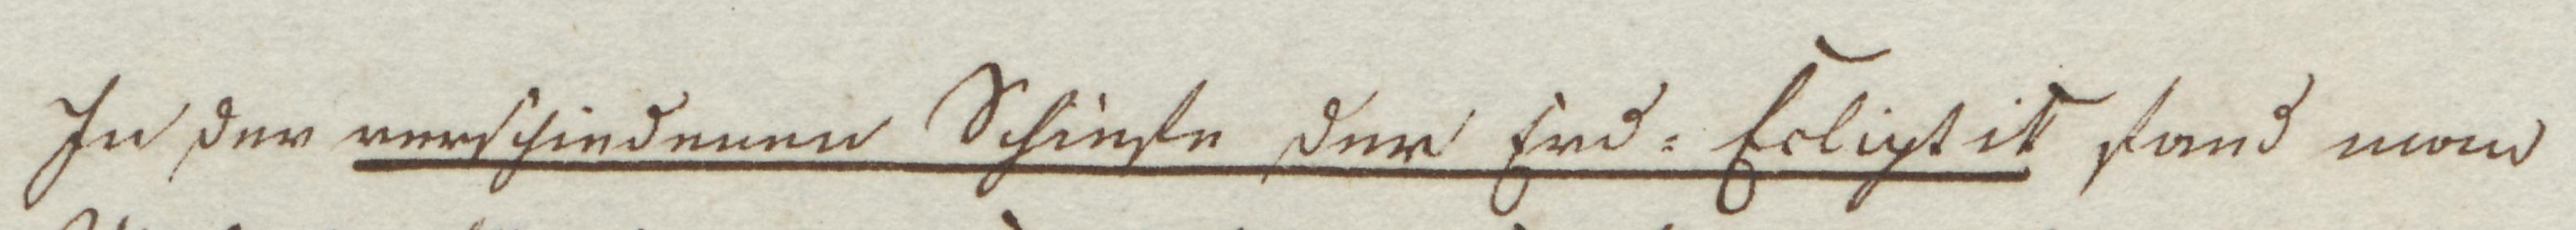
In der verschiedenen Schiefe der Erd-Ecliptik fand man
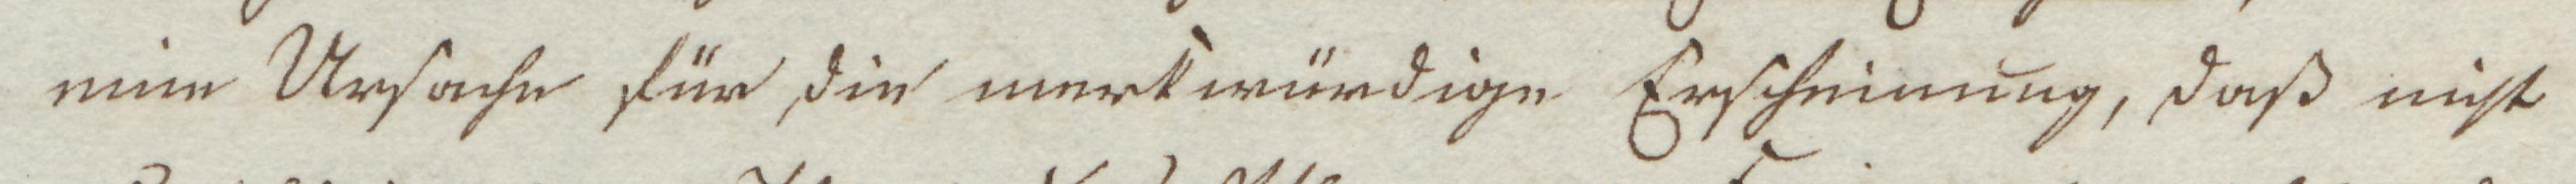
eine Ursache für die merkwürdige Erscheinung, daß nicht
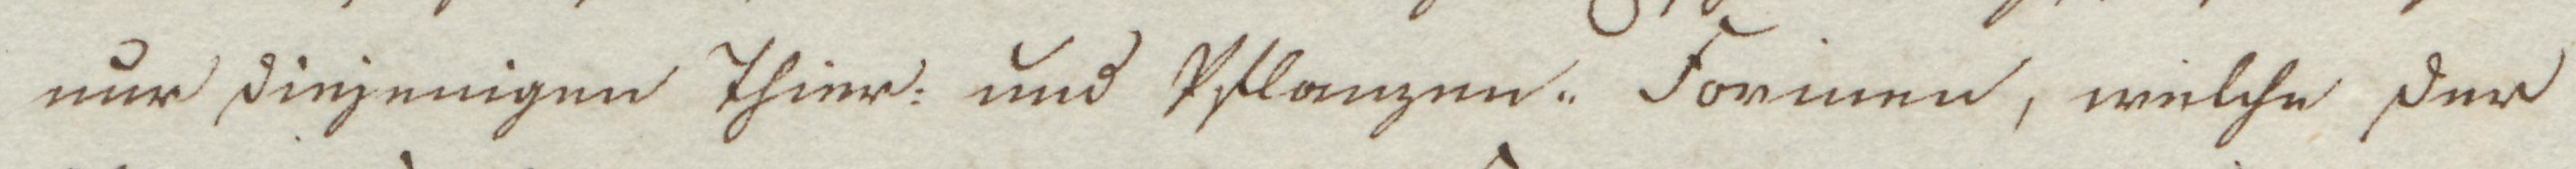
nur diejenigen Thier- und Pflanzen-Formen, welche der
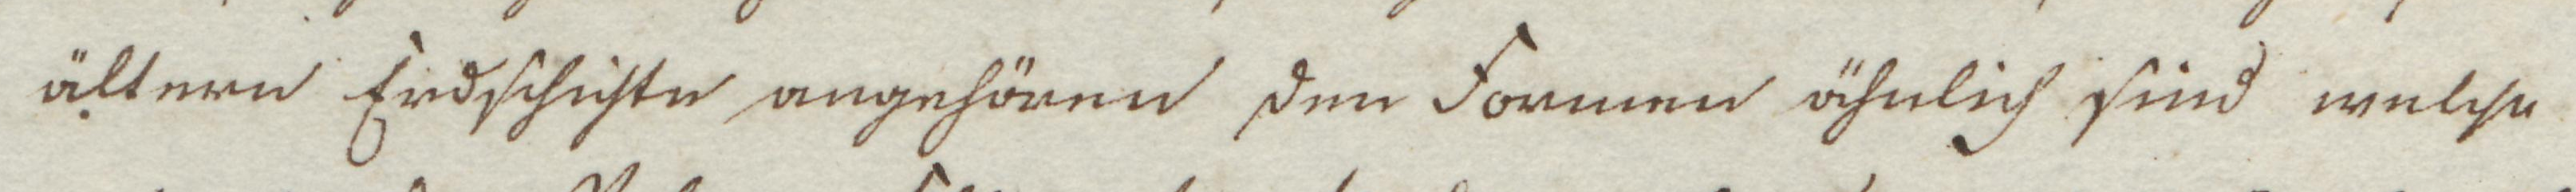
ältern Erdschichte angehören den Formen ähnlich sind welche
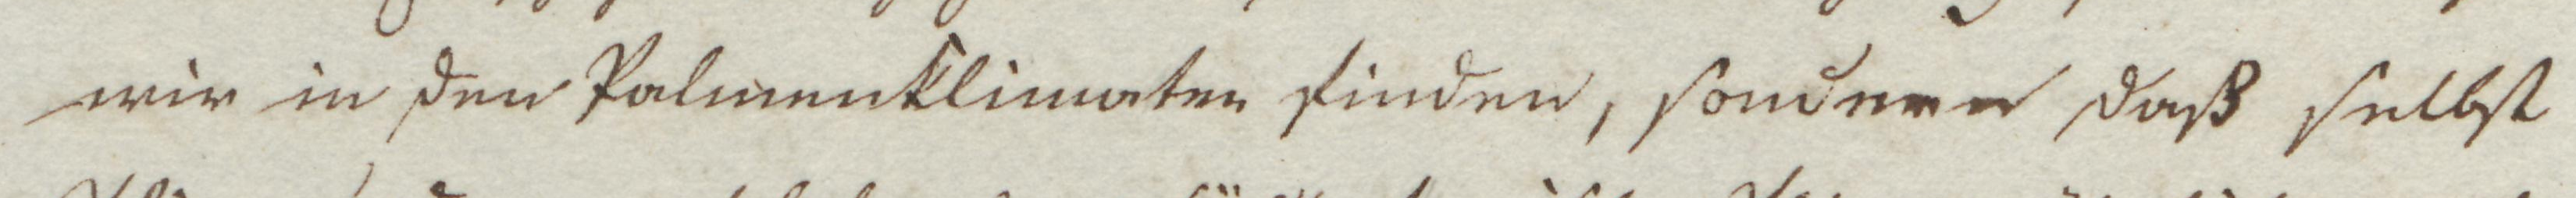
wir in den Palmenklimaten finden, sondern daß selbst
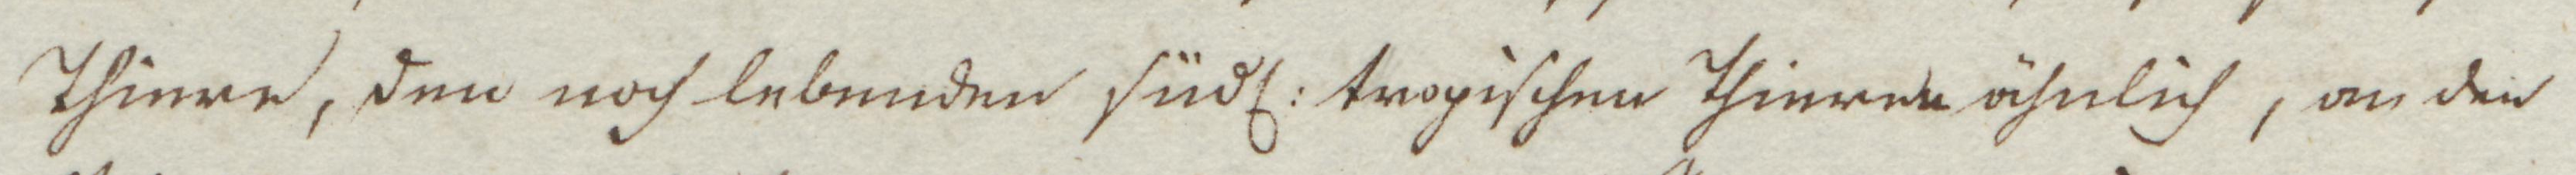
Thiere, den noch lebenden südl: tropischen Thieren ähnlich, an den
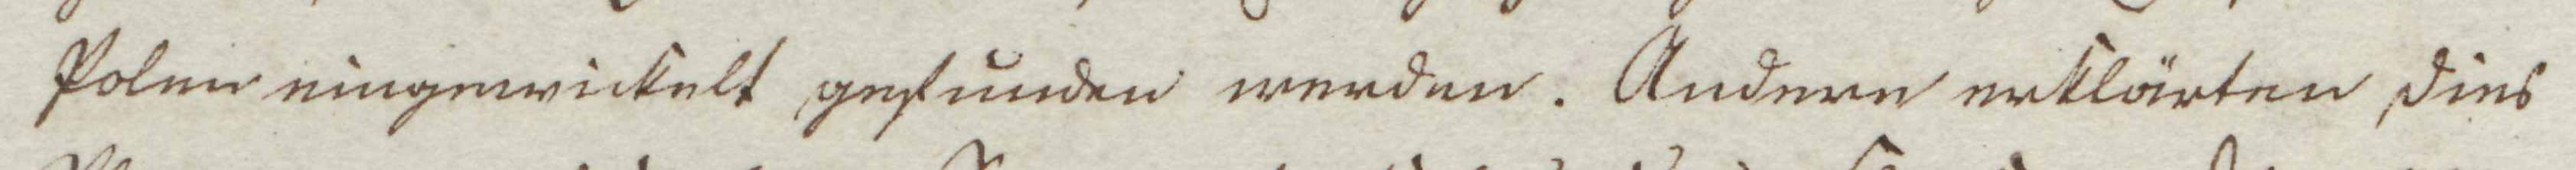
Polen eingewickelt gefunden werden. Andere erklärten dies
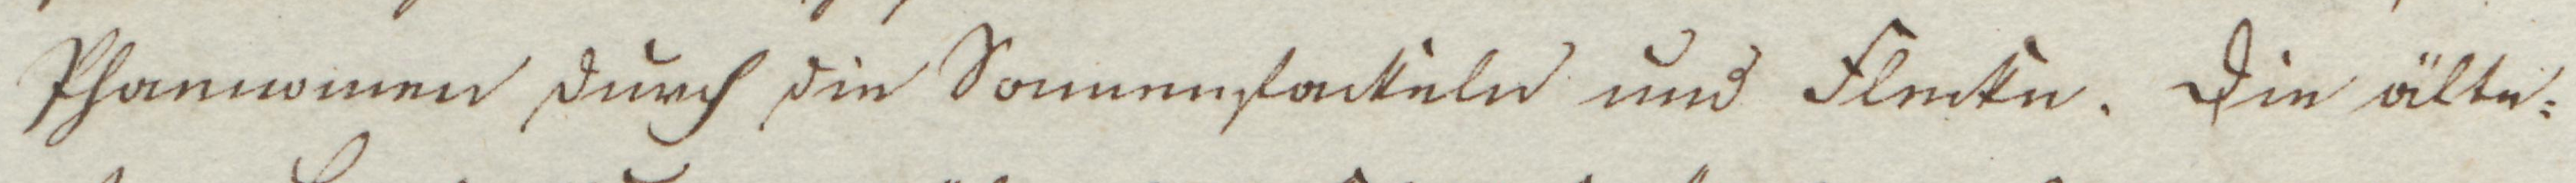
Phaenomen durch die Sonnenfackeln und Flecke. Die älte-
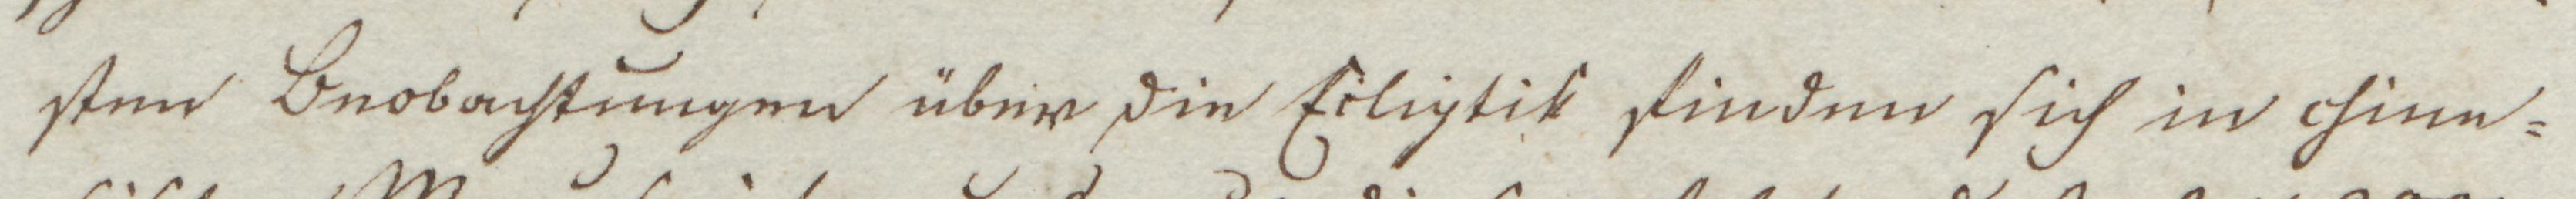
sten Beobachtungen über die Ecliptik finden sich in chine-
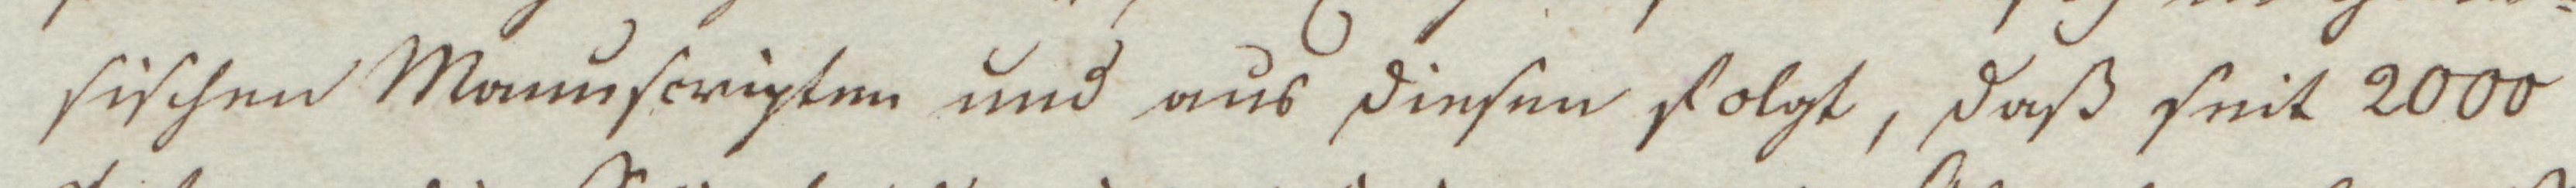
sischen Manuscripten und aus diesen folgt, daß seit 2000
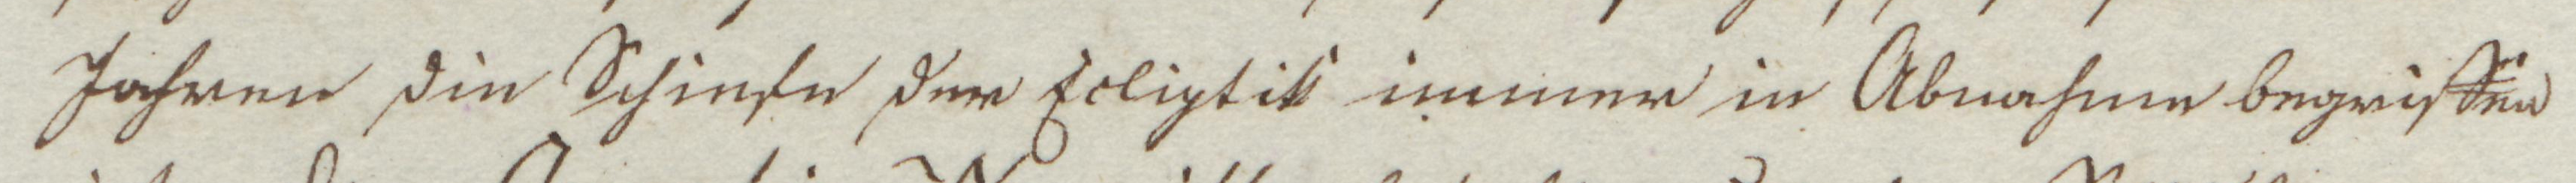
Jahren die Schiefe der Ecliptik immer in Abnahme begriffen
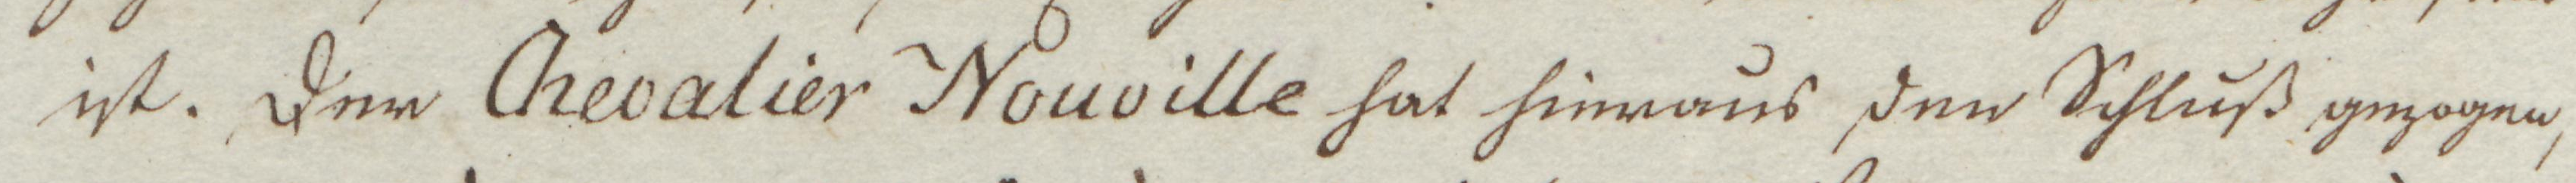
ist. Der Chevalier Nouville hat hieraus den Schluß gezogen,
